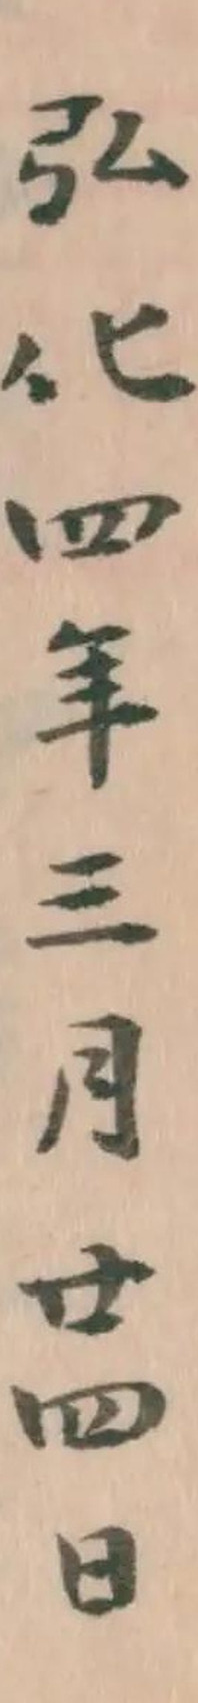弘化四年三月廿四日
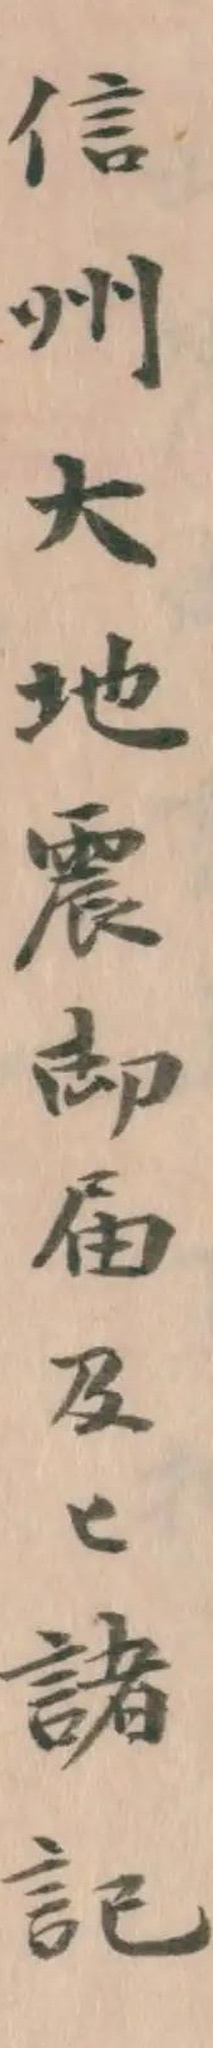信州大地震御届及ひ諸記
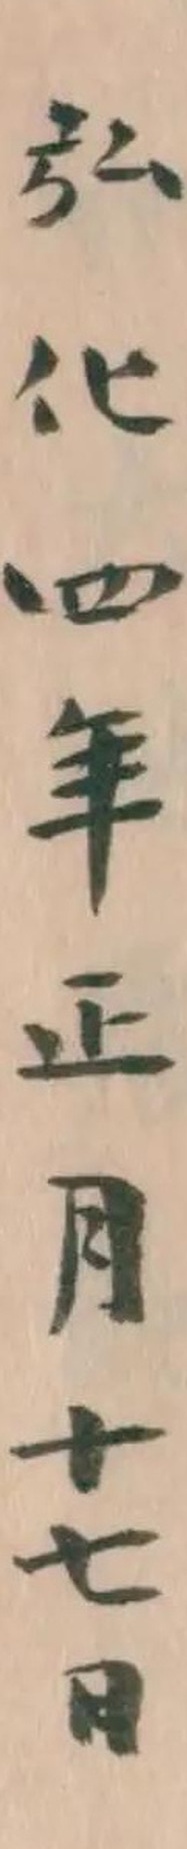弘化四年正月十七日
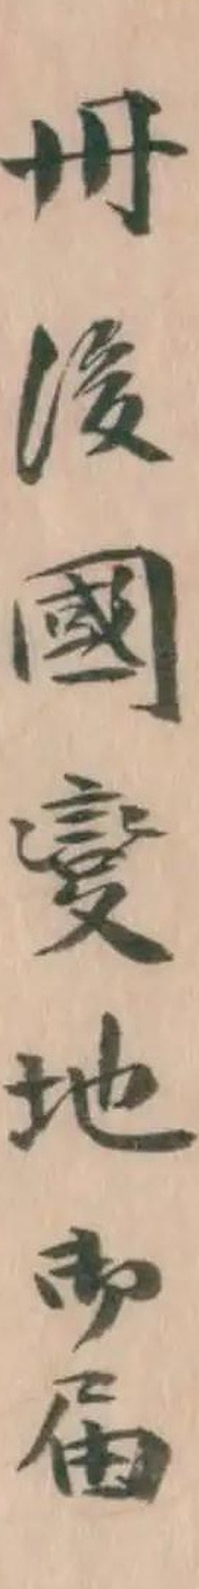丹後国変地御届
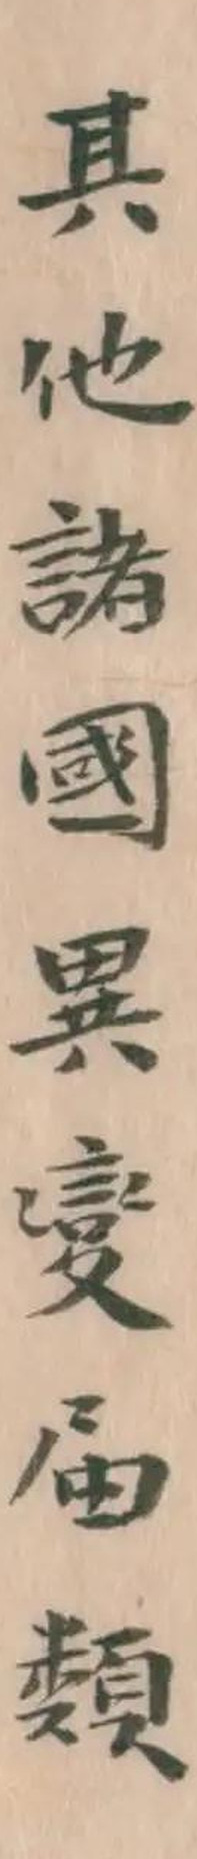其他諸国異変届類

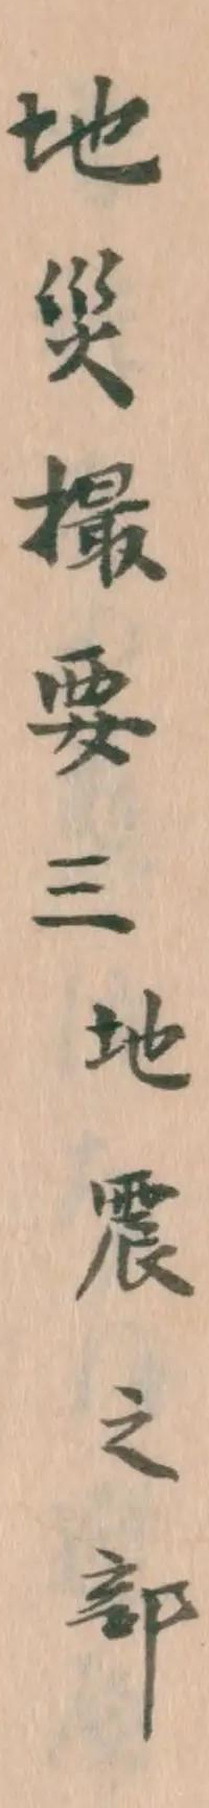地震撮要三地震之部
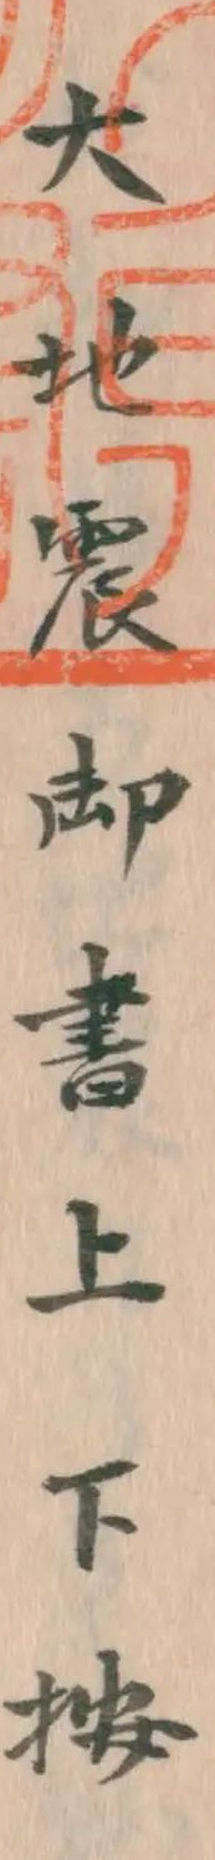大地震御書上下按
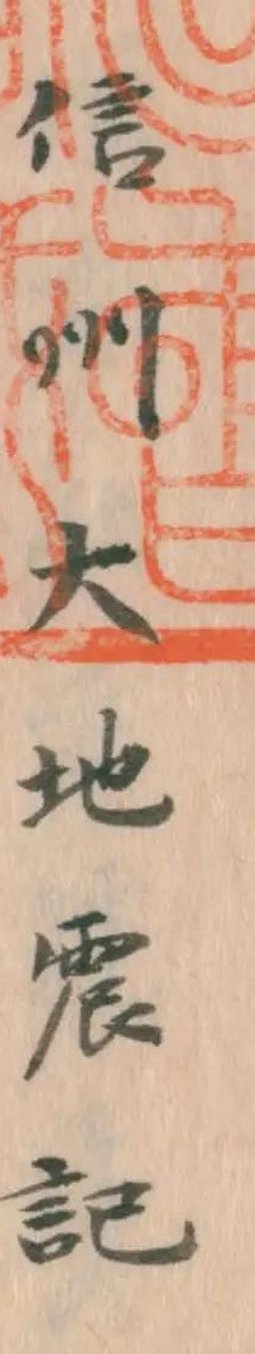信州大地震記
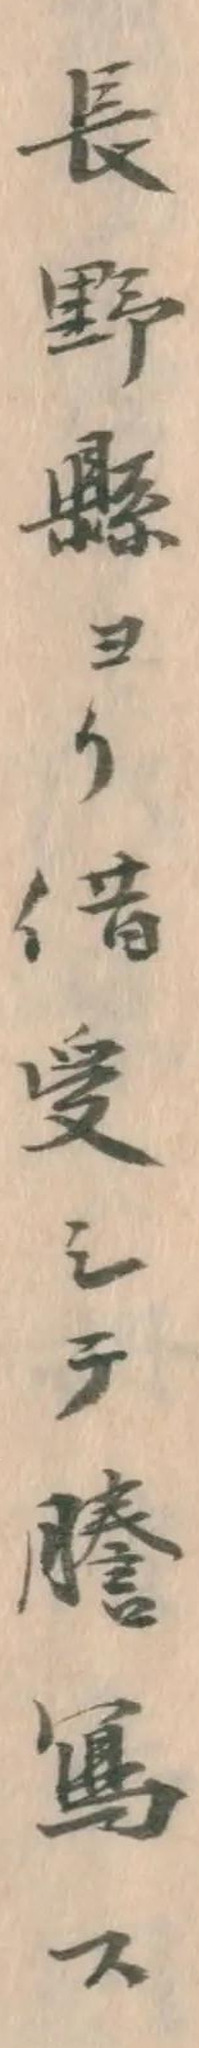長野県ヨリ借受シテ謄写ス

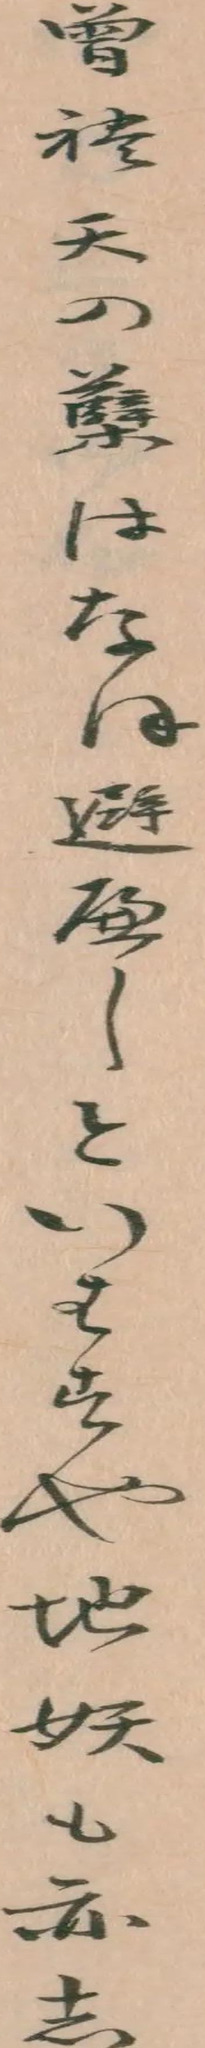それ天の蘖はなを避へしといはすや地妖も亦し
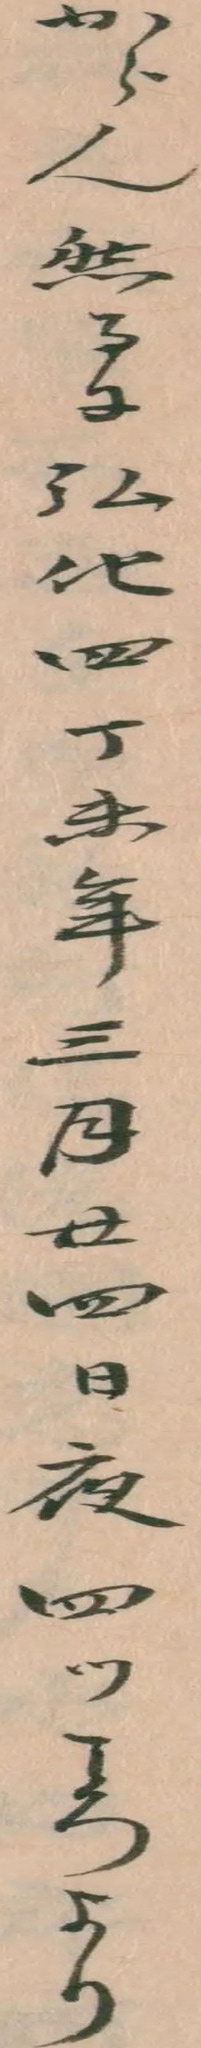からん然るに弘化四丁未年三月廿四日夜四ッころより
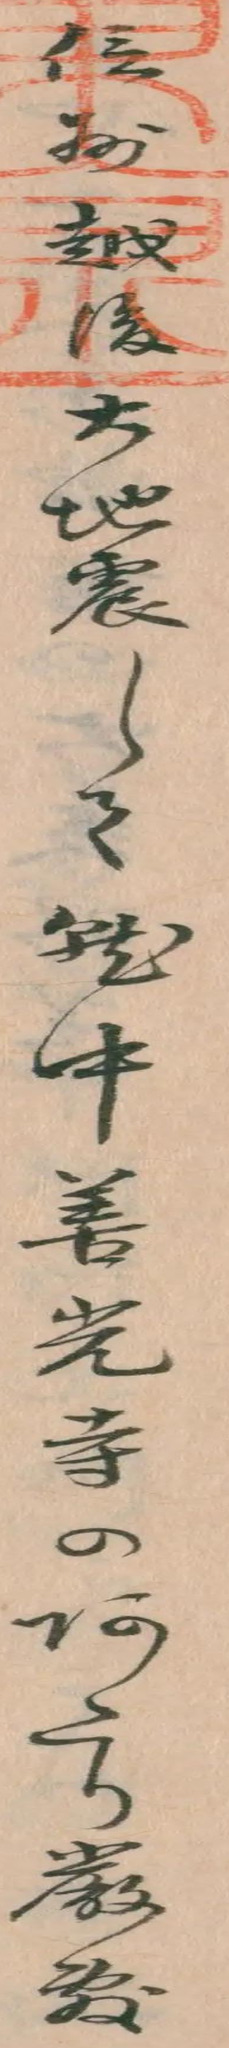信州越後大地震して就中善光寺のあたり厳敷
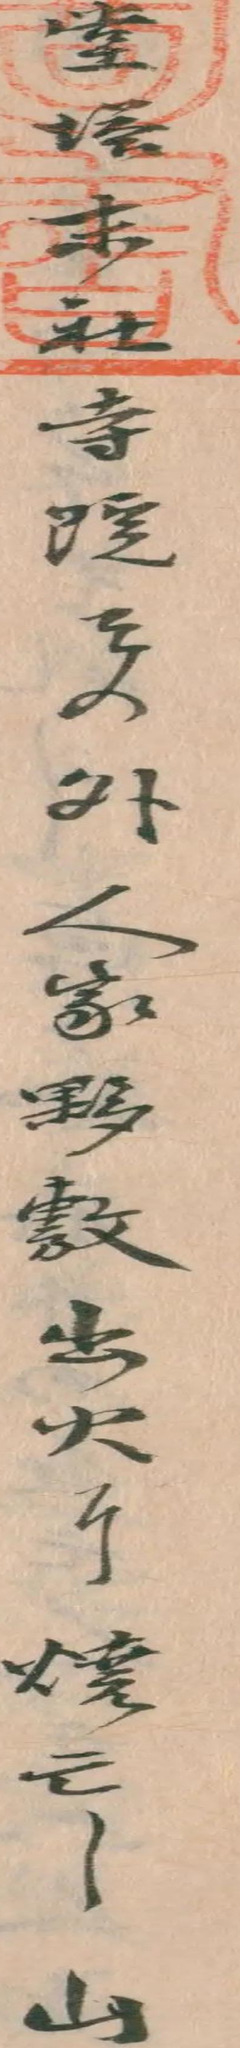堂塔末社寺院その外人家夥敷出火に焼亡し山
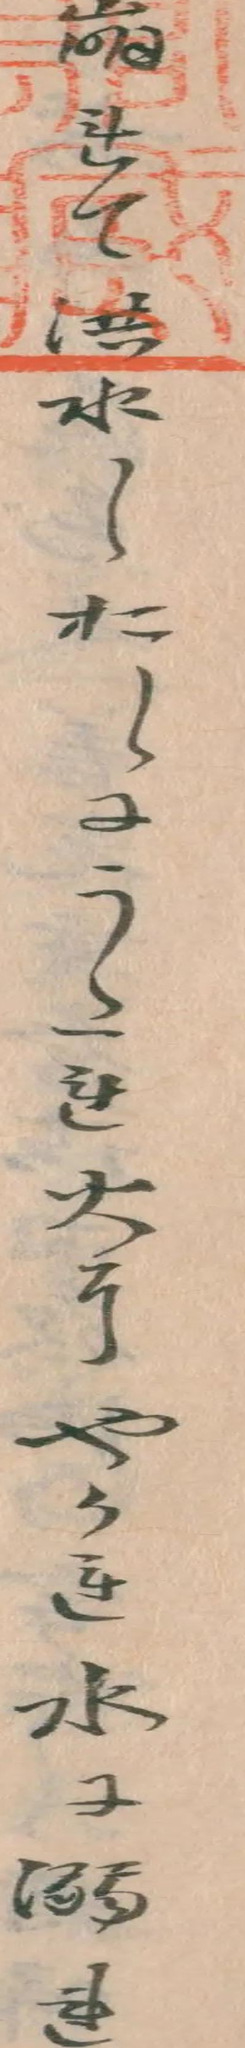崩て洪水しおしにうたれ火にやかれ水に溺れ
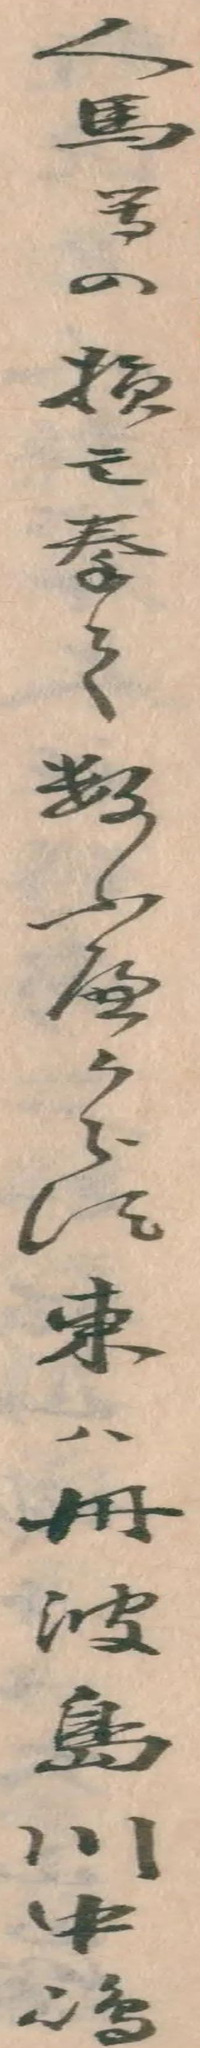人馬等の損亡挙て数ふへからず東ハ丹波島川中嶋
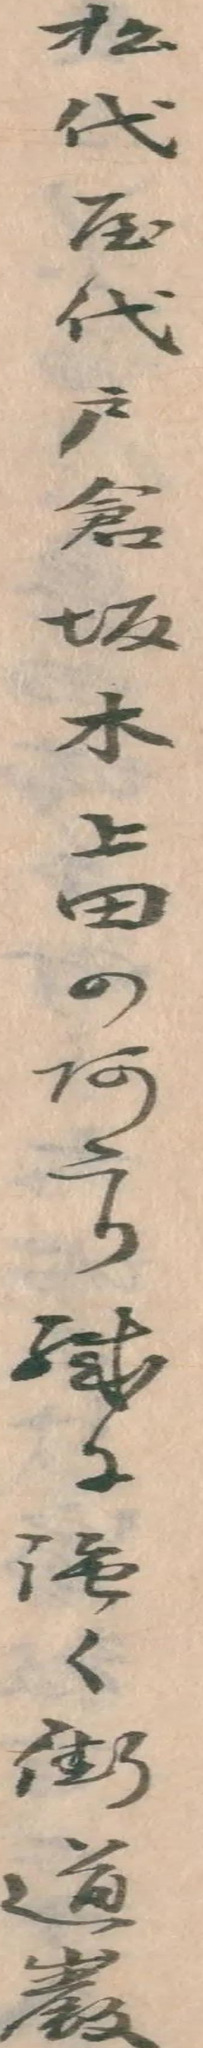松代屋代戸倉坂木上田のあたり殊に強く街道巖
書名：地災撮要. 巻3(地震之部)-巻4(噴火之部)
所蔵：国立国会図書館 National Diet Library, JAPAN
